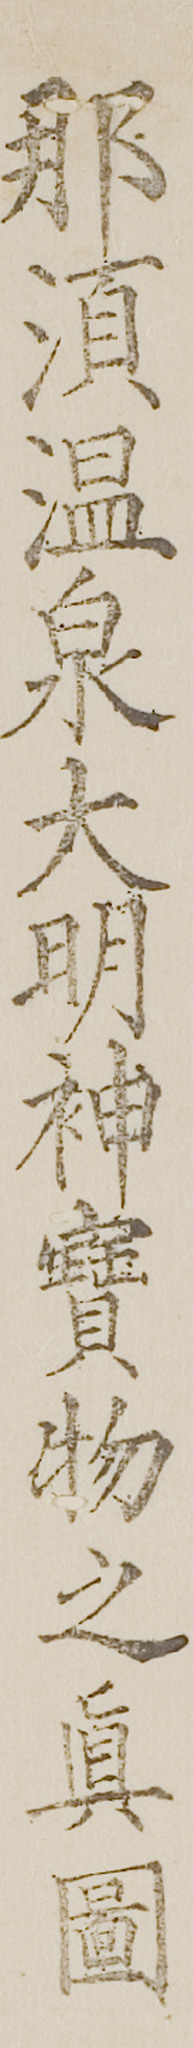那須温泉大明神宝物之真図
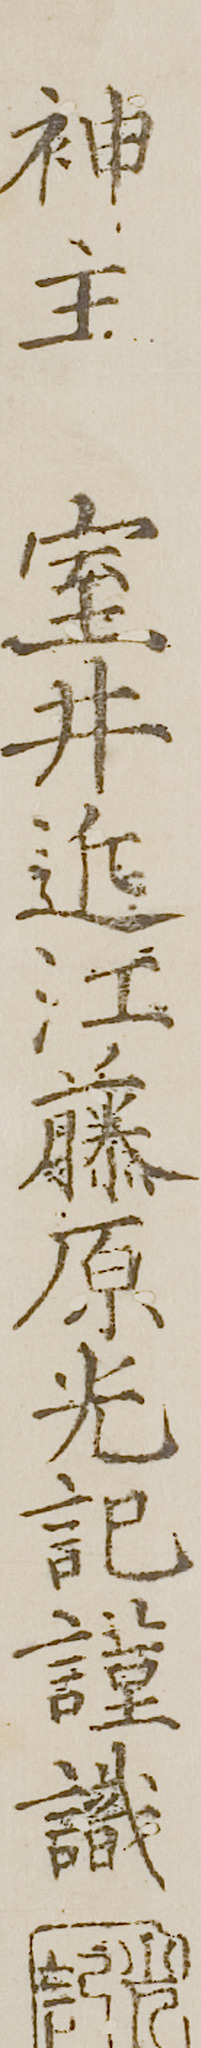神主室井近江藤原光記謹識光記
